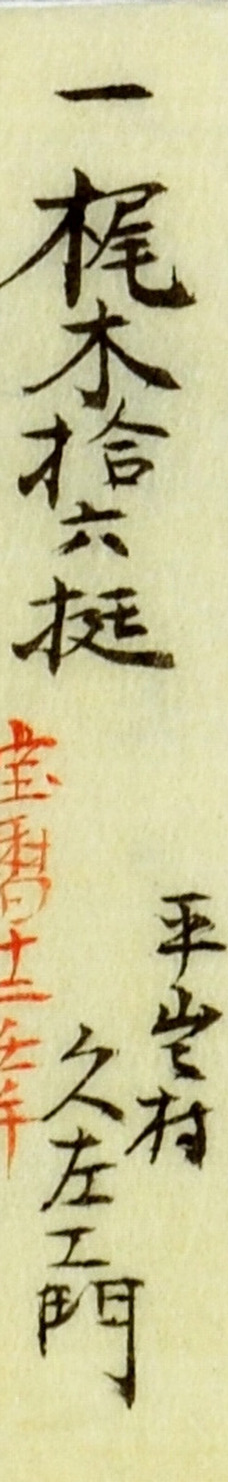一梶木拾六挺久左エ門
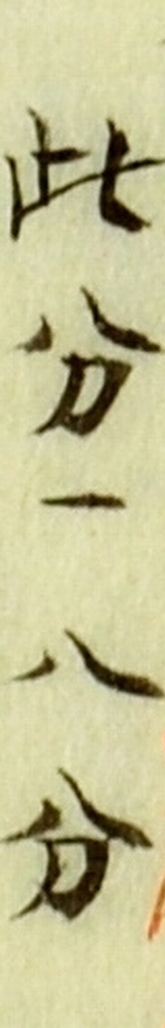此分一八分
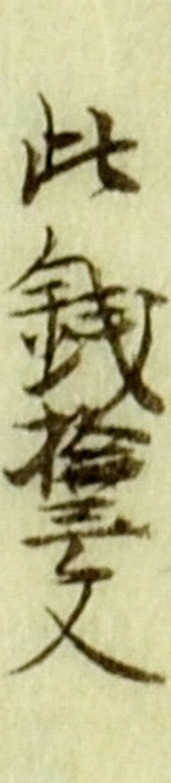此銭拾壱文
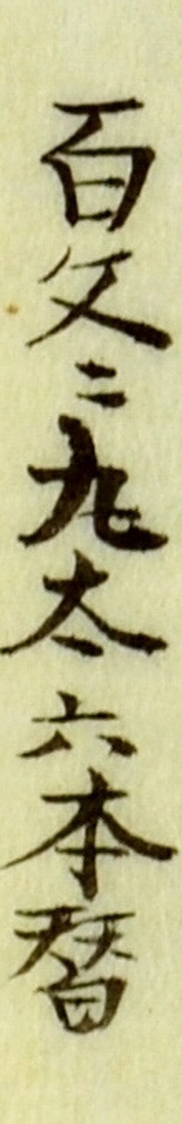百文ニ丸太六本替
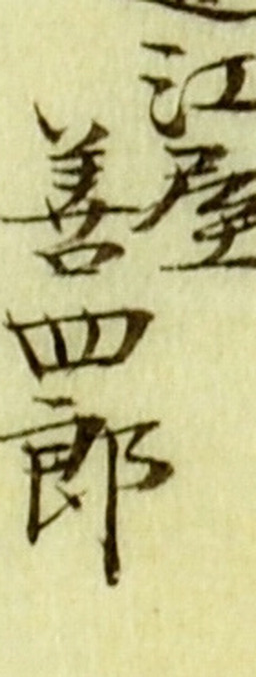善四郎
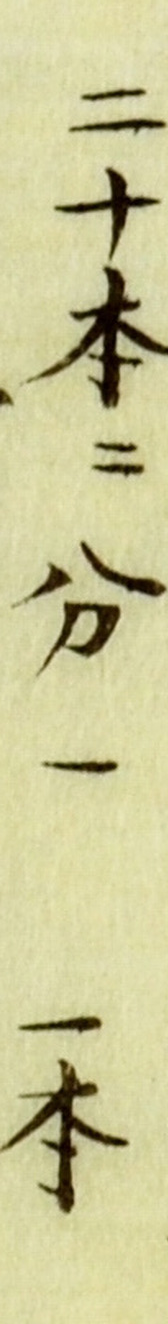二十本ニ分一一本
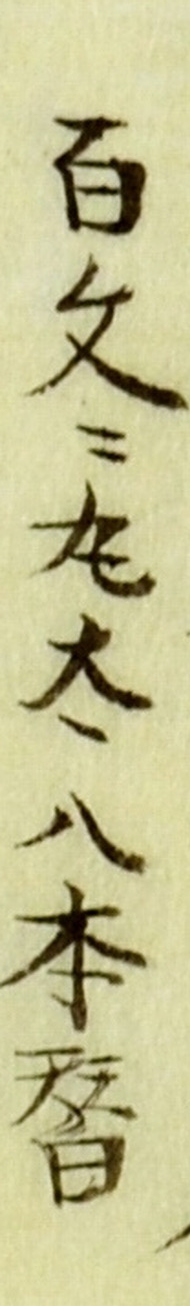百文ニ丸太八本替
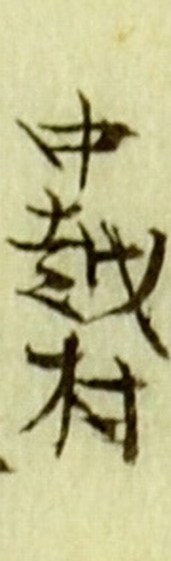中越村
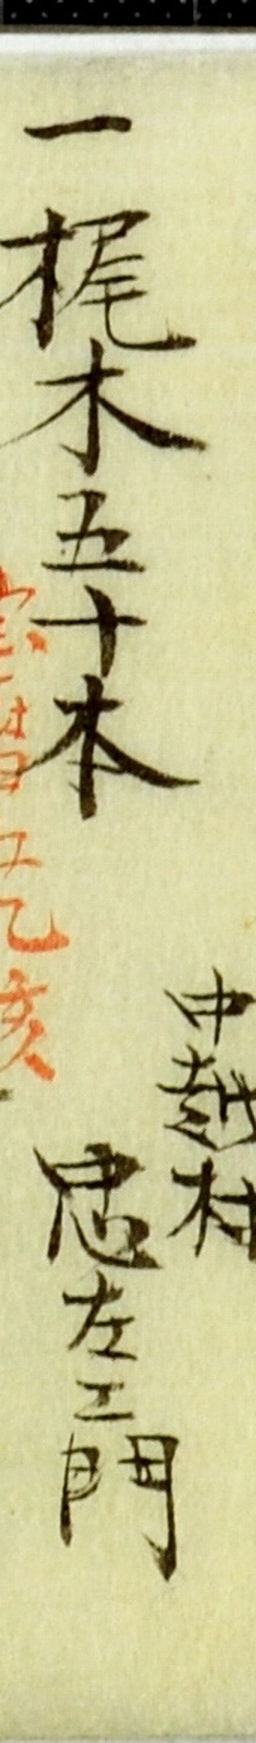一梶木五十本忠左エ門
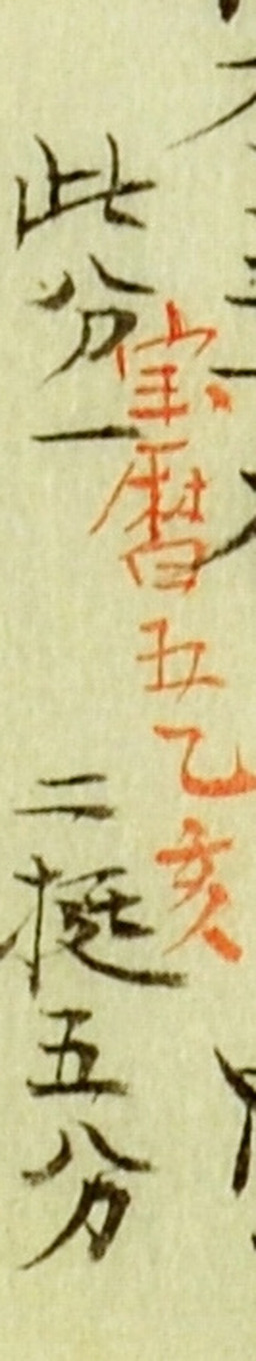此分一二挺五分
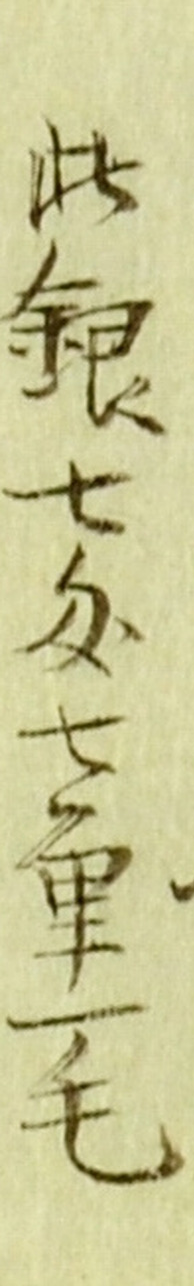此銀七匁七厘一毛
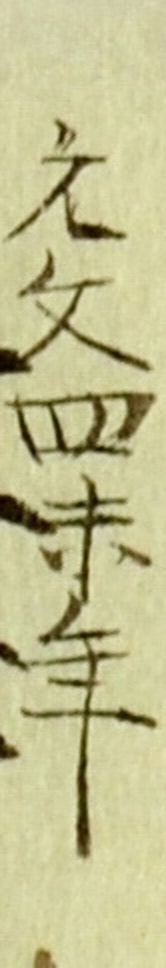文永四未年
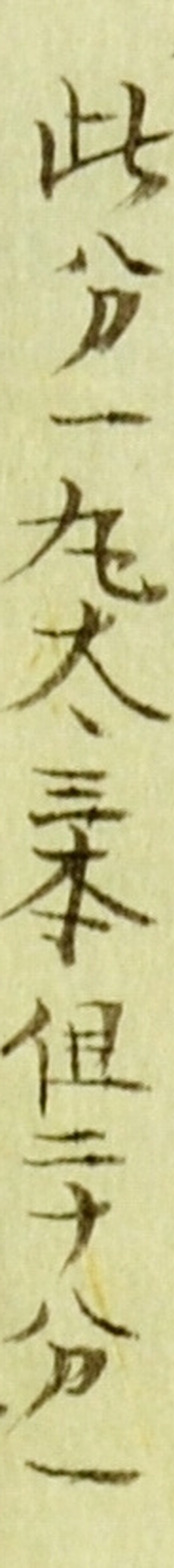此分一丸太三本但ニ十分一
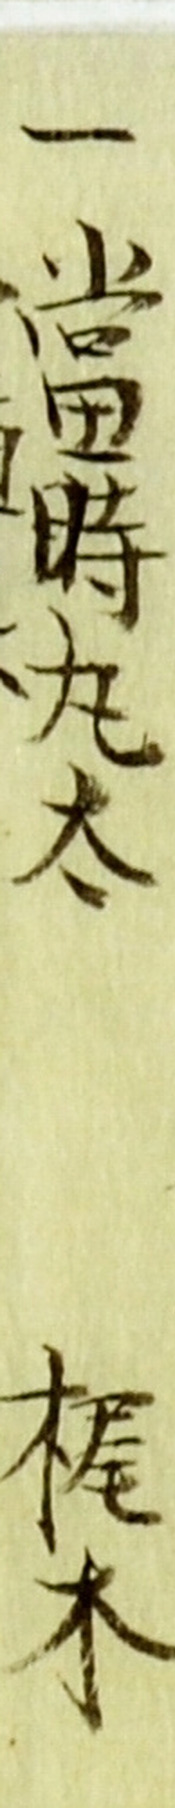一当時丸太梶木
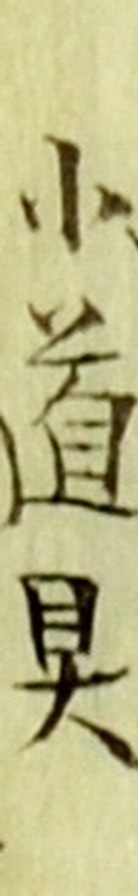小道具
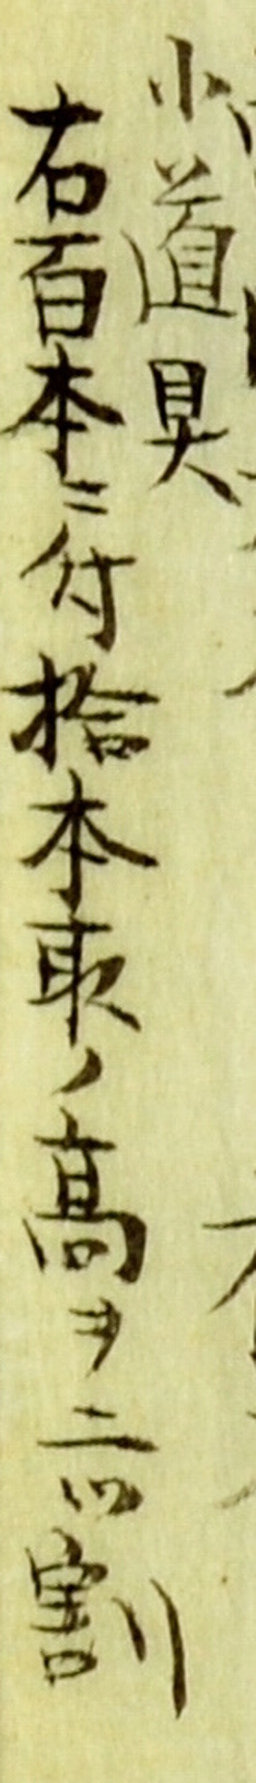右百本ニ付拾本取ノ高ヲ二ツ割
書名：分一御定法
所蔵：伊那市立高遠町図書館・合同会社AMANE
